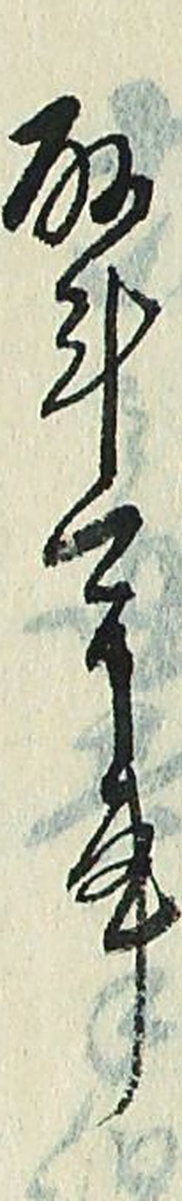取計可申事
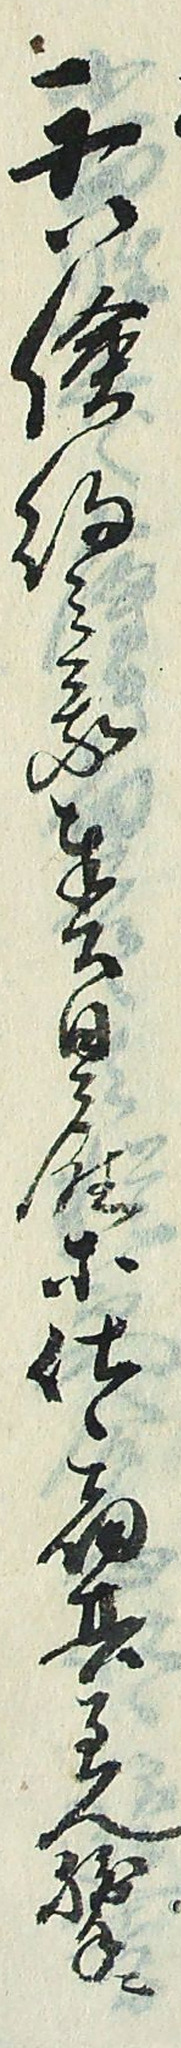一右倹約之義奉公日雇等仕候者共ゑ勝手ニ

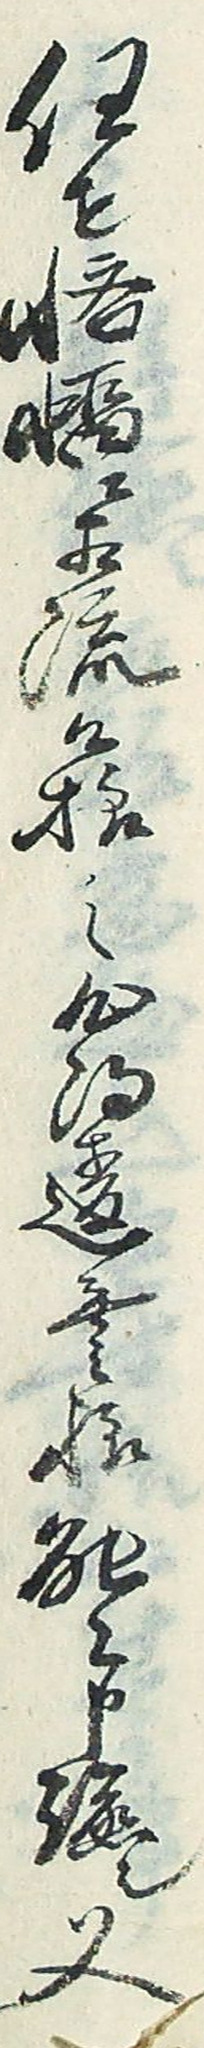任せ悋懎ニ相流候様之心得違無之様能々申諭シ又
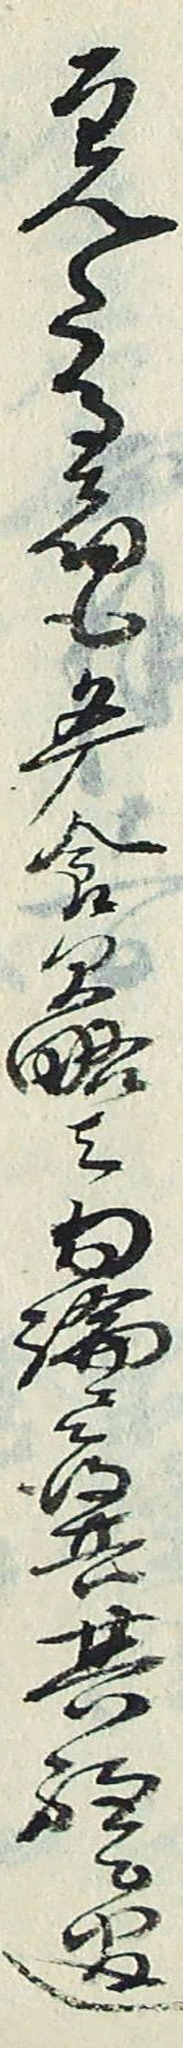主人たる者も麁食欠略者勿論ニ候得共其程も過
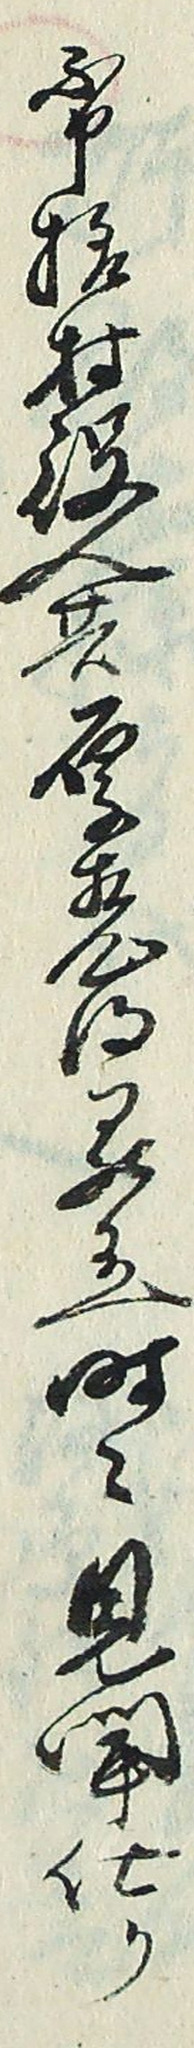不申様村役人共厚相心得罷有時々見聞仕り
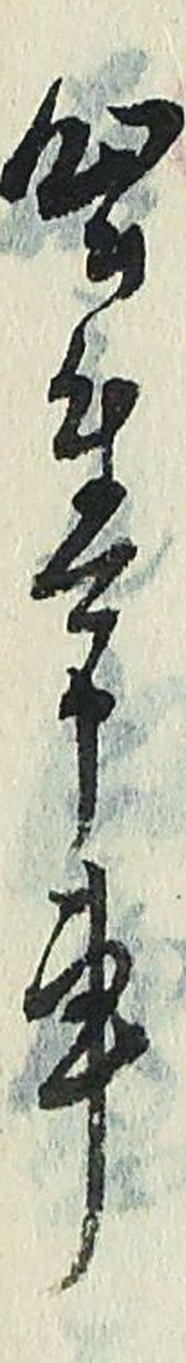心ヲ付可申事
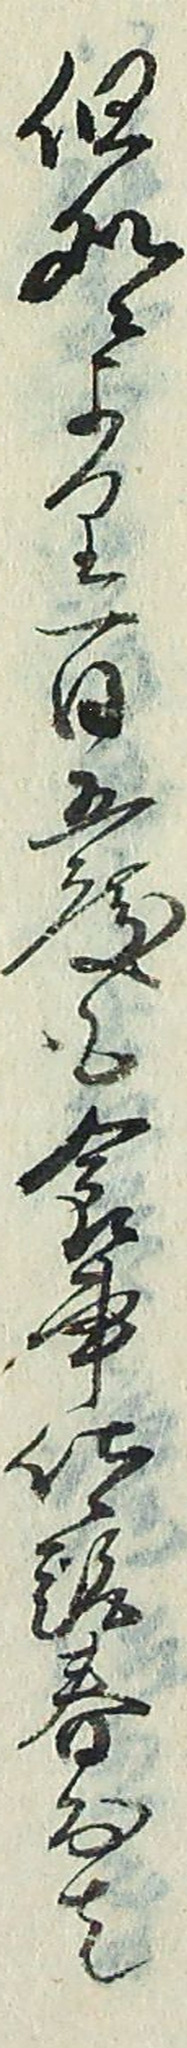但処ニより一日五度も食事仕候趣春分者
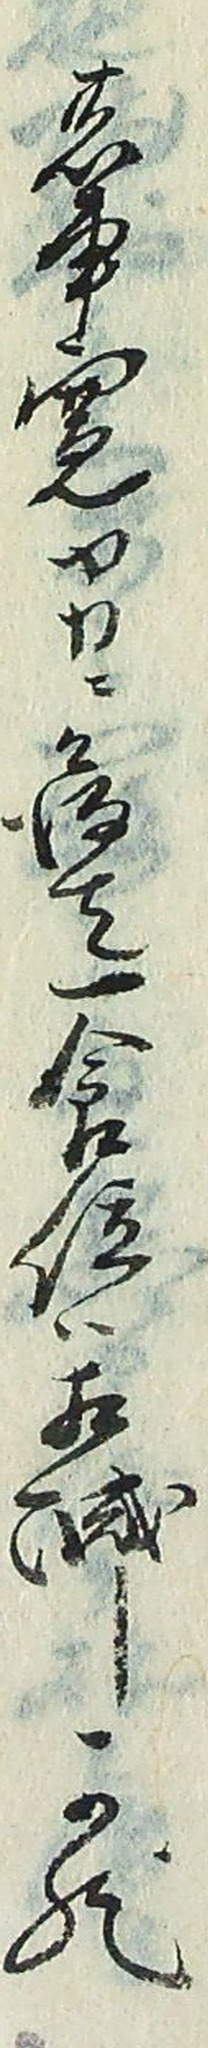農事寛ヤカニ候得者一食位ハ相減し可然
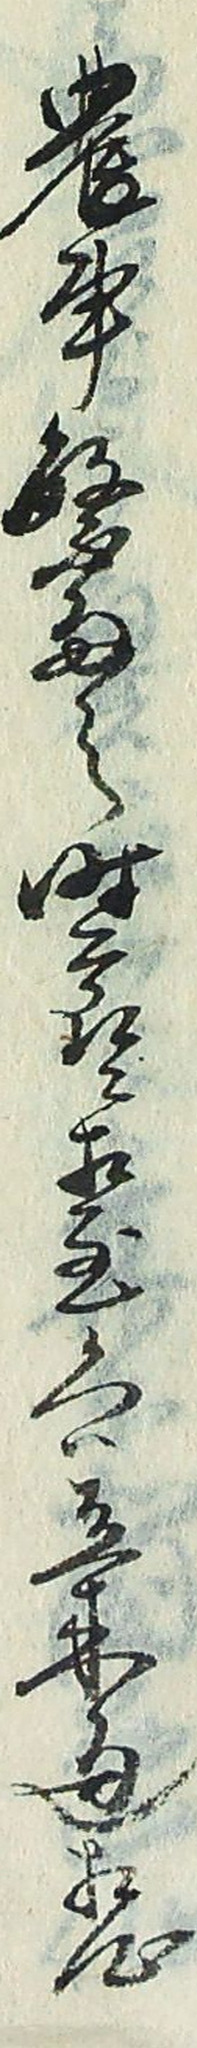農事繁多之時節ニ相至候へハ有来通相心
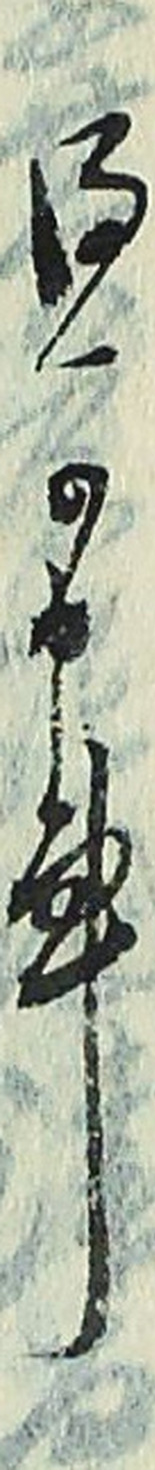得可申事
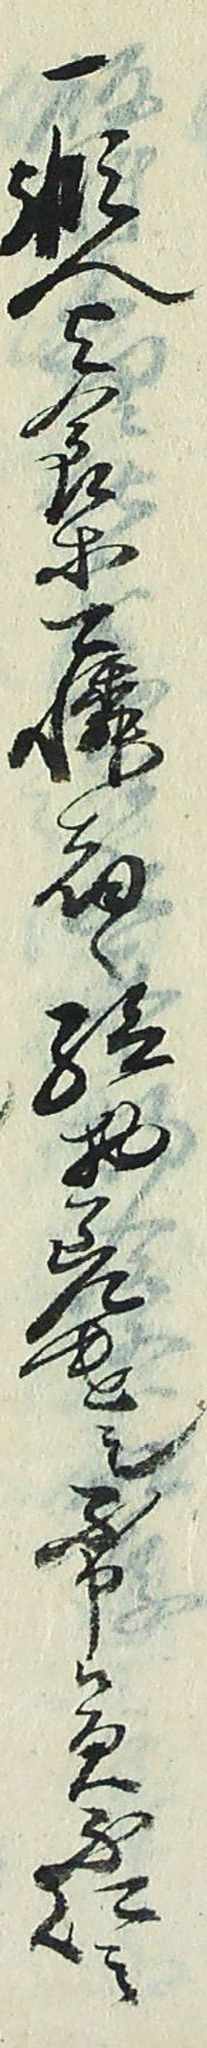一非人乞食等可憐者へ給物差遣シ不申候而ハ不仁之
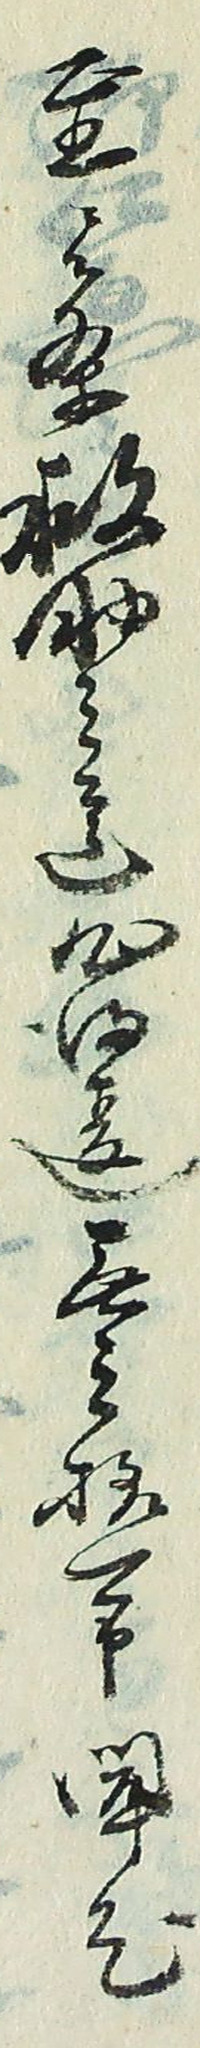至ニ候条救助之道心得違無之様可申聞尤
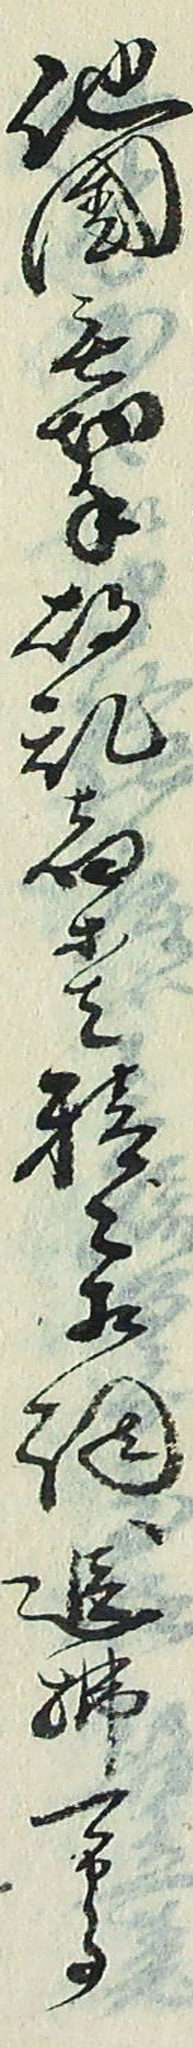他國無切手胡乱者等者精々相調へ追拂可申事
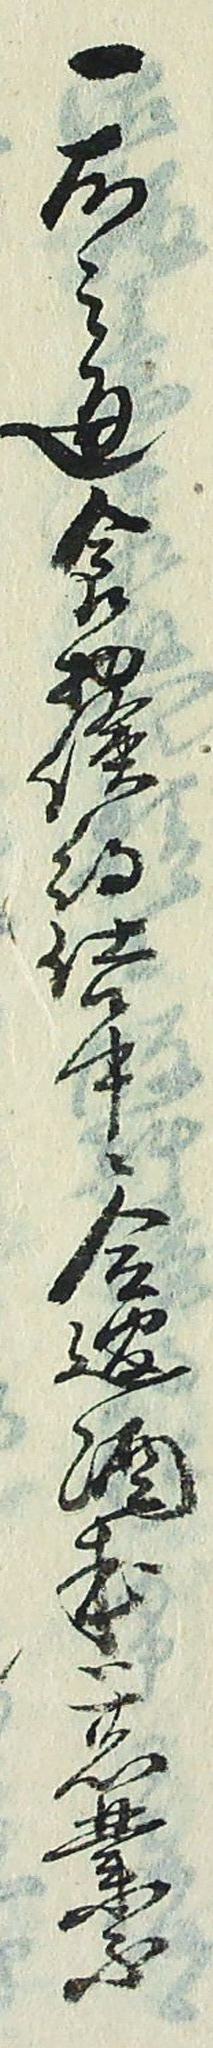一右之通食物倹約仕候中ニ全過酒成ハ農業不
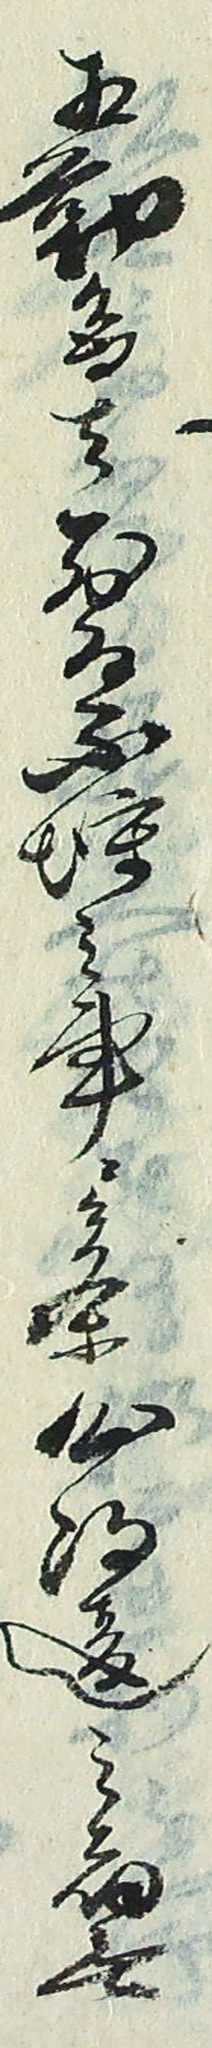相勤候而者別而不埒之事ニ候条心得違之者無
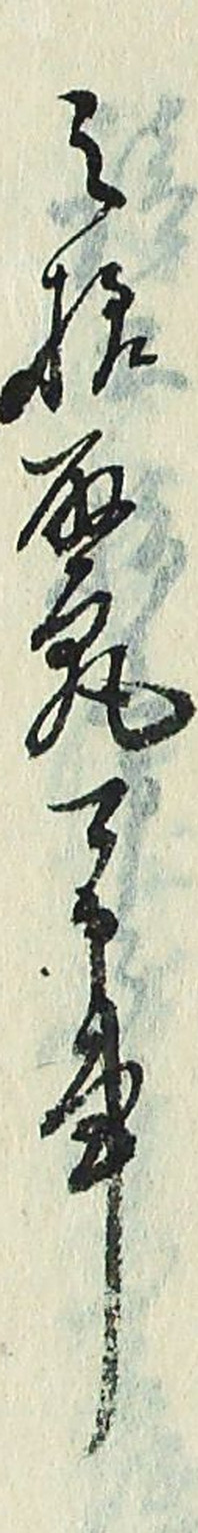之様取究可申事
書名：諸御趣意書并御下知向之写
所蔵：鳴門教育大学 Naruto University of Education
